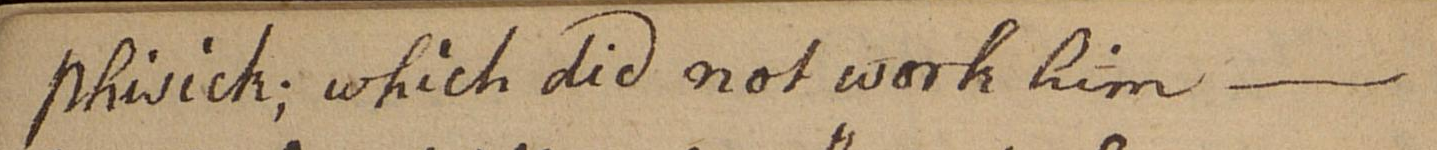Phisick; which did not work him-
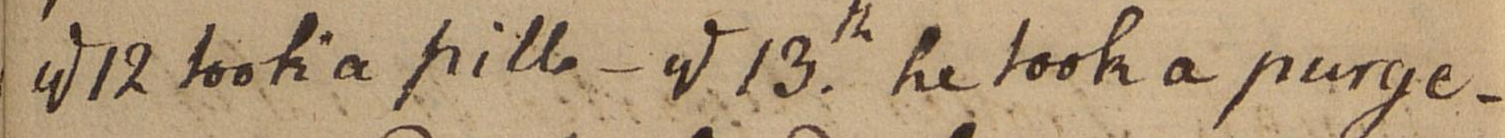y^e 12 took a pill- y^e 13^th he took a purge-
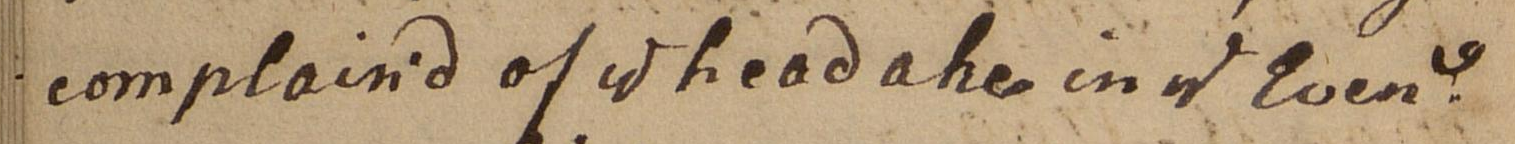complain'd of y^e headake in y^e Even^g.
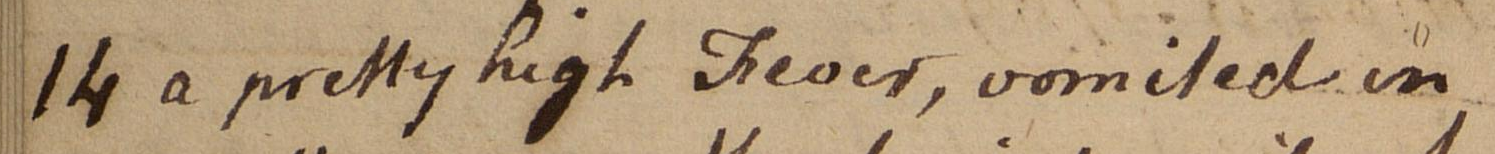14 a pretty high Fever, vomited in
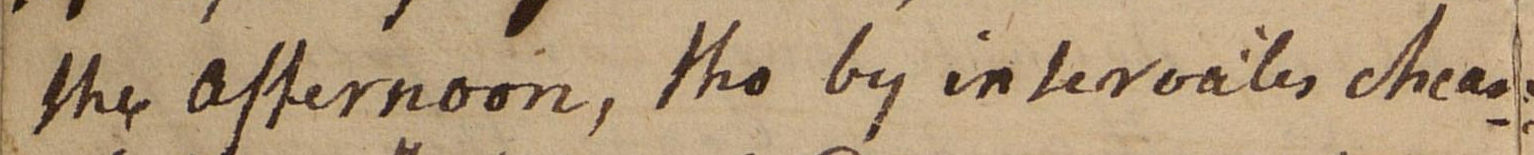the afternoon, tho by intervales chear
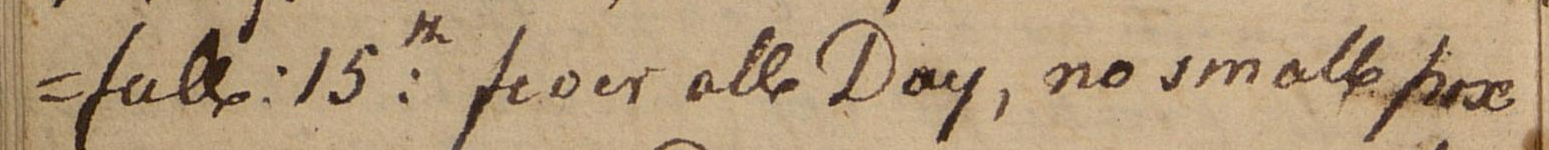-full: 15^th: fever all Day, no small pox
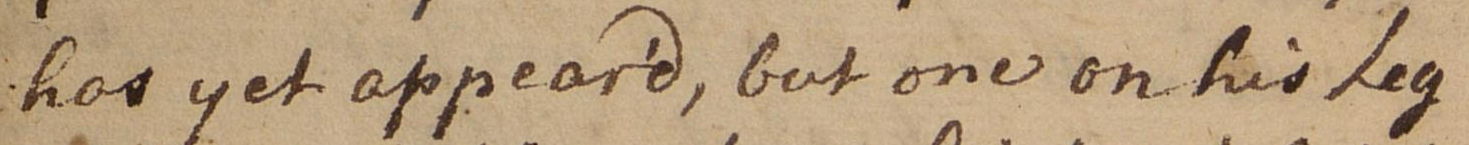has yet appear'd, but one on his Leg
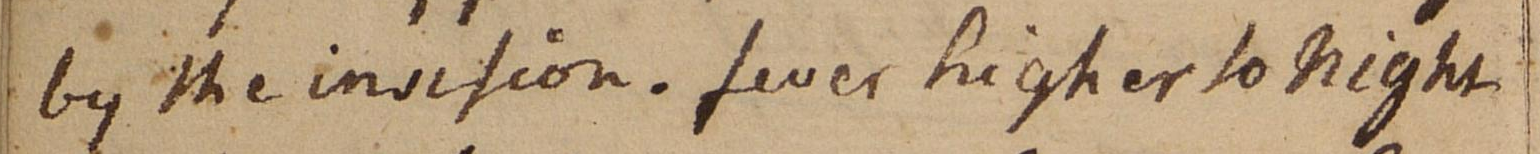by the insision. fever higher to night
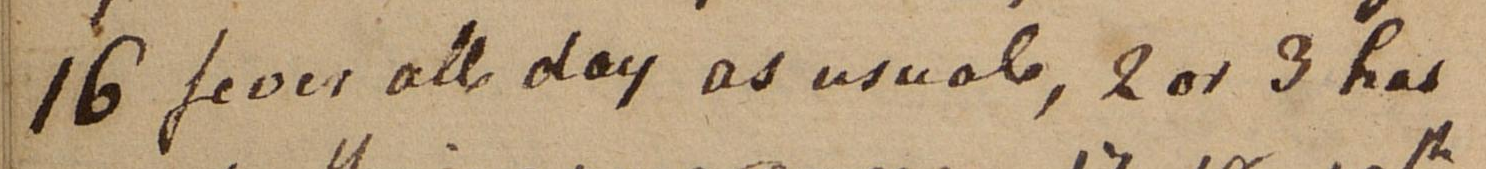16 fever all day as usual, 2 or 3 has
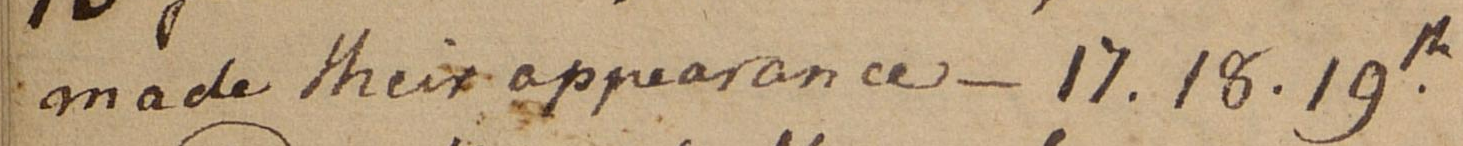made their appearance- 17. 18. 19^th.
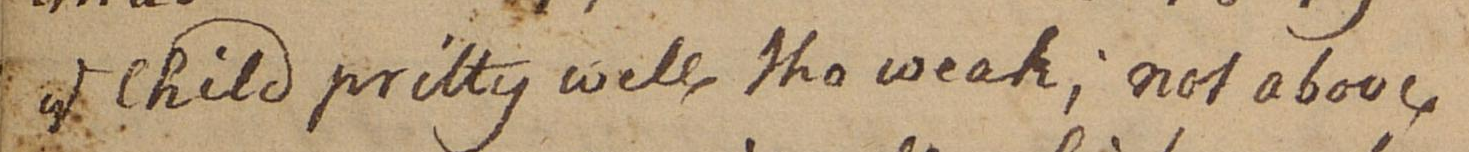y^e Child pritty well, tho weak; not above
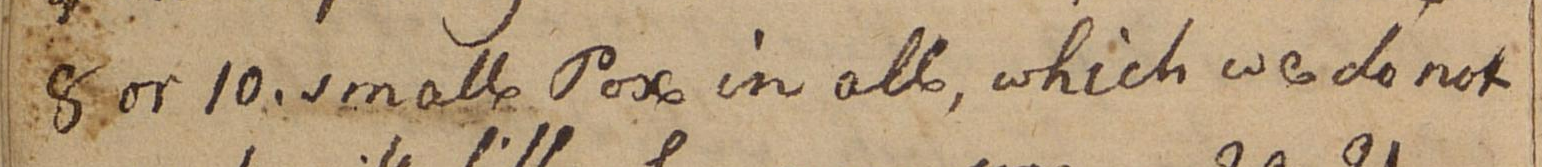8 or 10. small Pox in all, which we do not
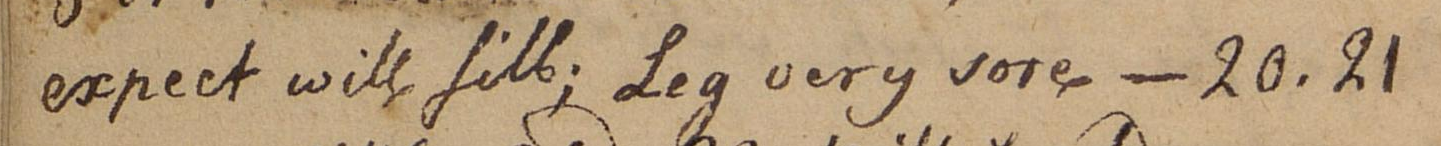expect will Sill; Leg very sore- 20. 21
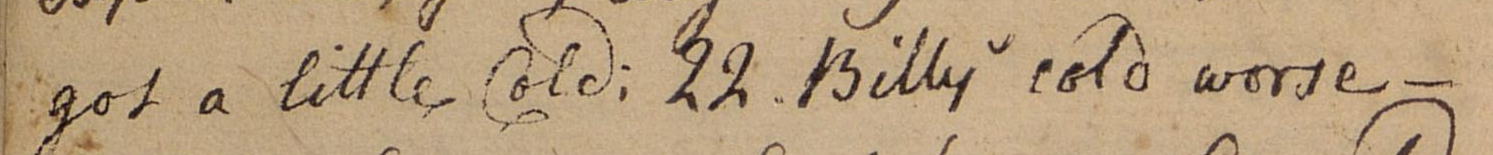got a little Cold: 22. Billy^s cold worse-
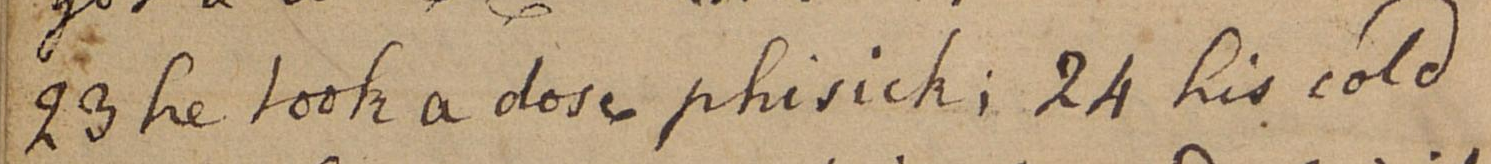23 he took a dose phisick; 24 his cold
